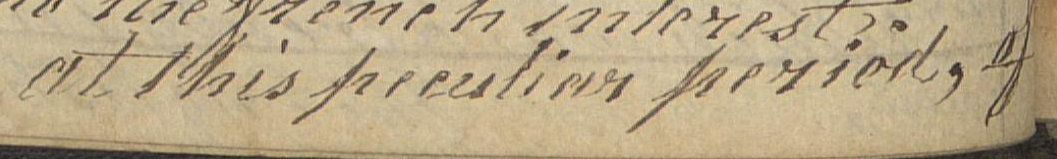at this peculiar period,
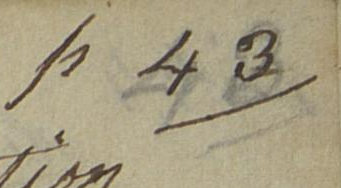p 43
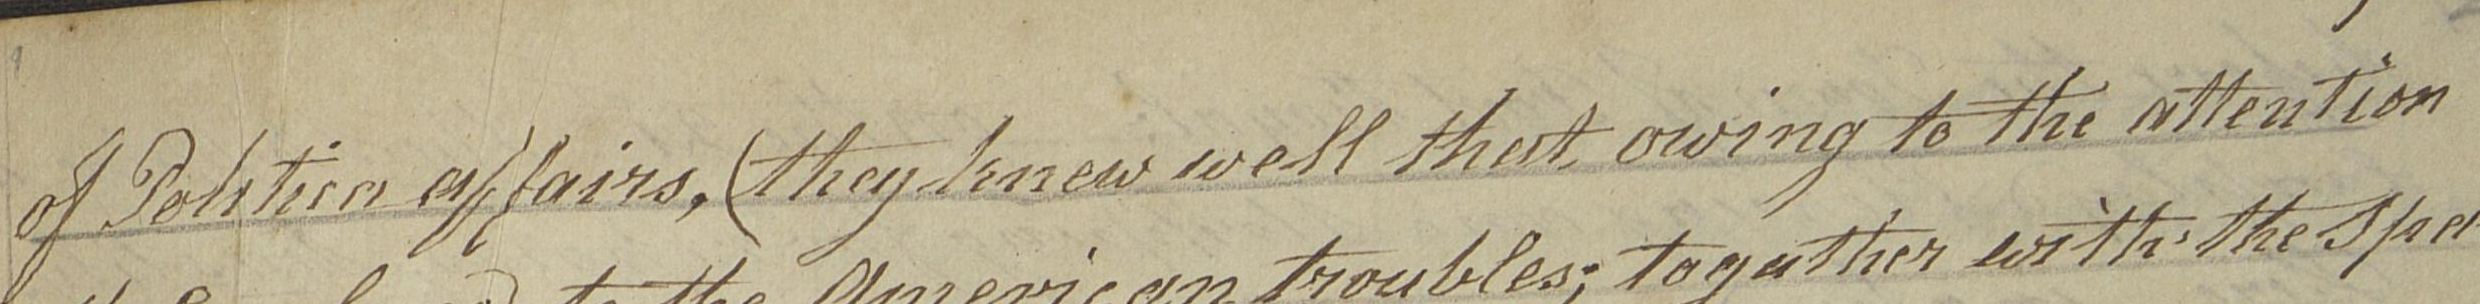of Politica affairs, (they knew well that owing to the attention
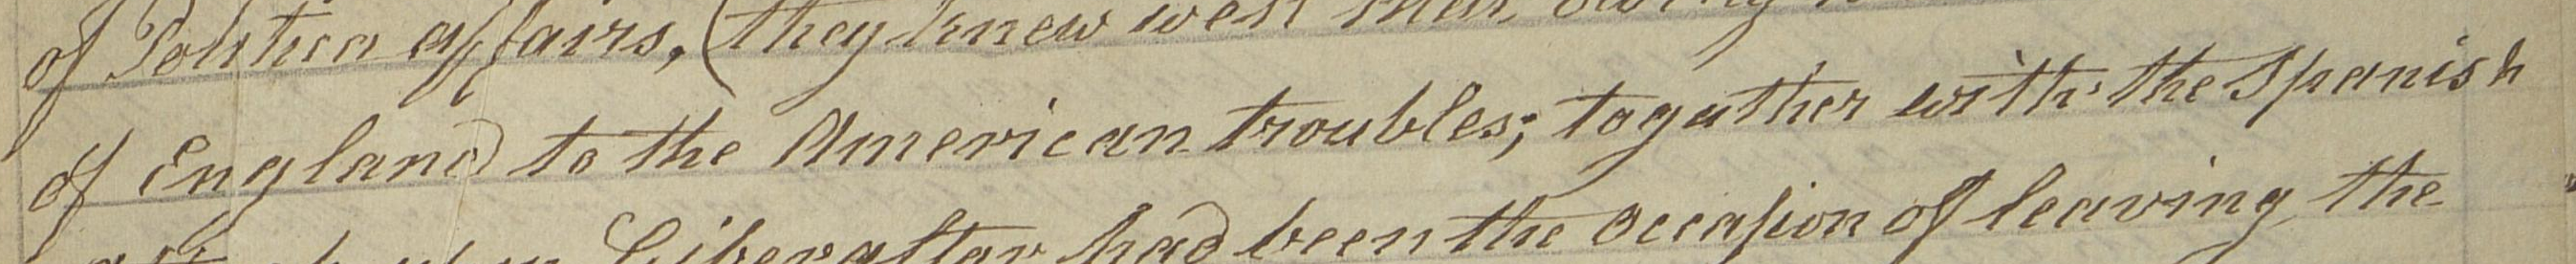of England to the American troubles; together with the Spanish
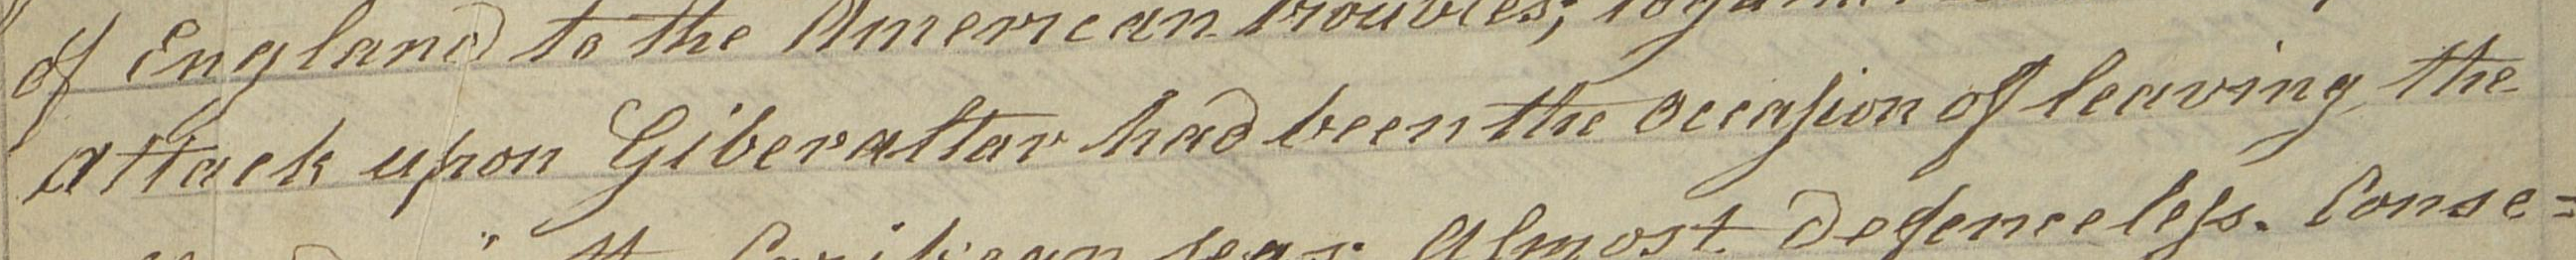attack upon Giberaltar had been the occasion of leaving the
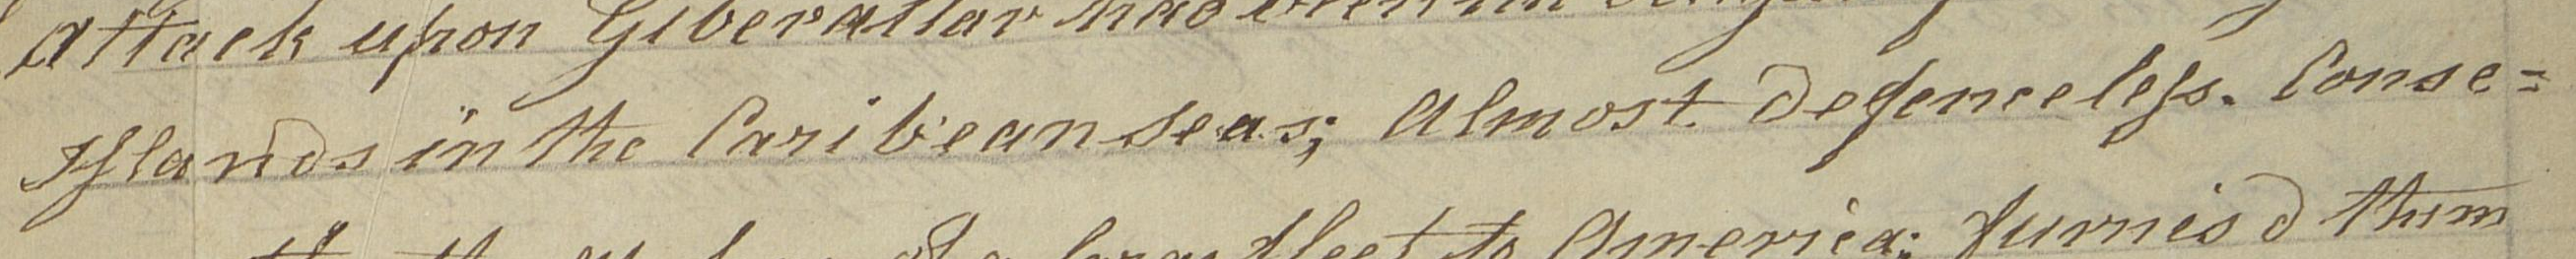Islands in the Caribean seas; almost defenceless. Conse-
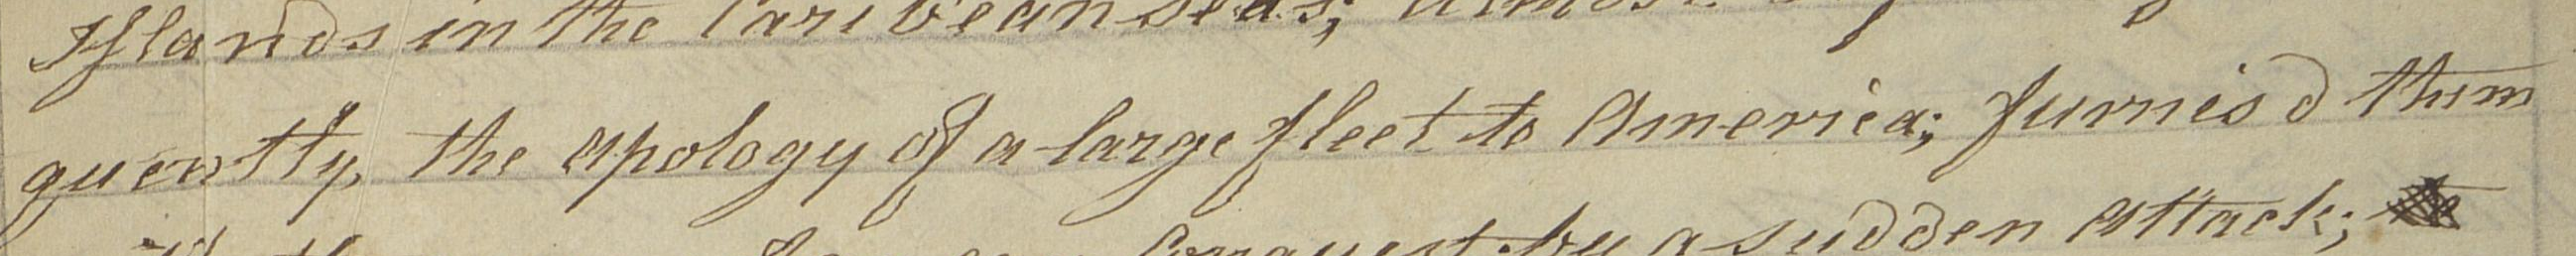-quently the Apology of a large fleet to America furnisd them
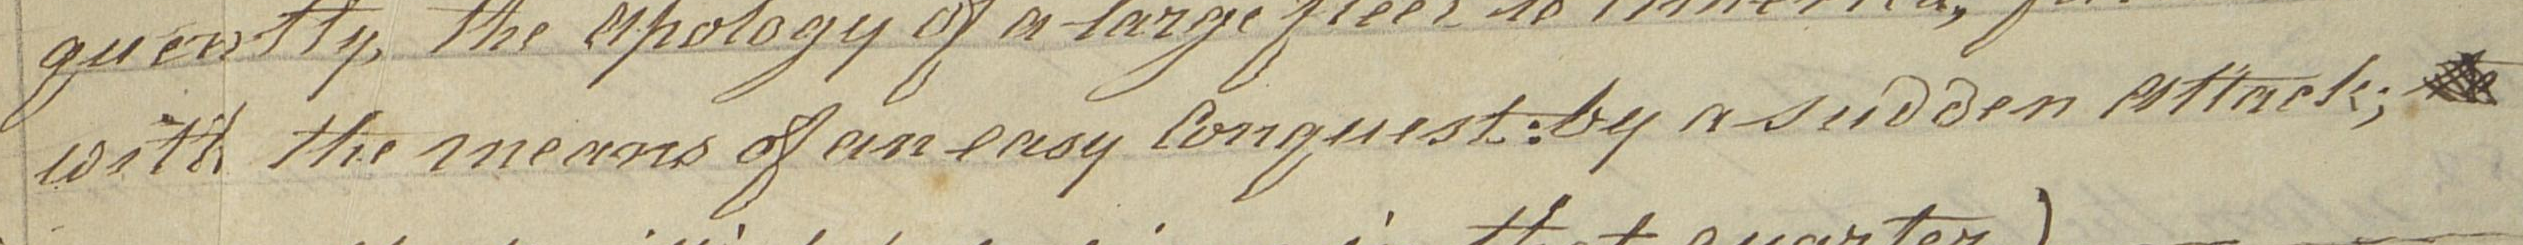with the means of an easy Conquest: by a sudden attack;
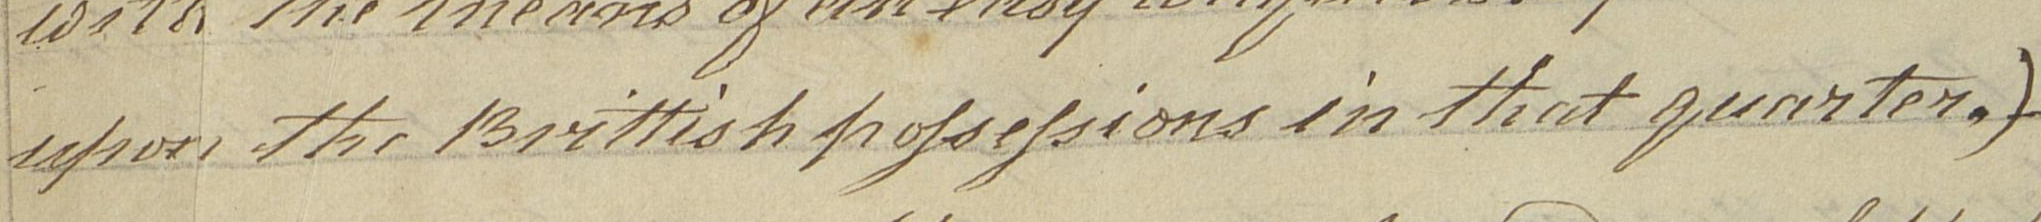upon the Brittish possessions in that quarter.)
